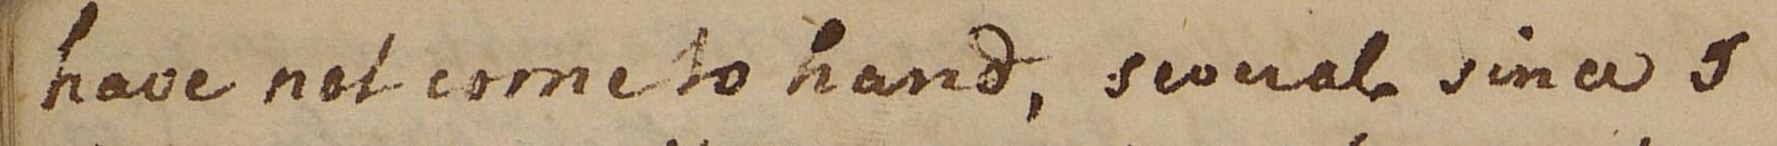have not come to hand, several since I
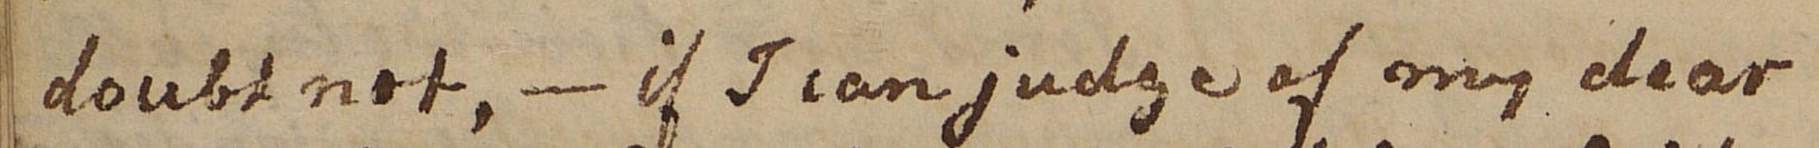doubt not.- if I can judge of my dear
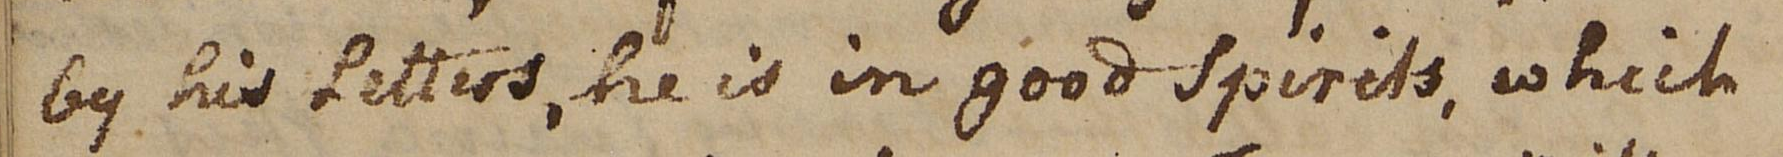by his Letters, he is in good Spirits, which
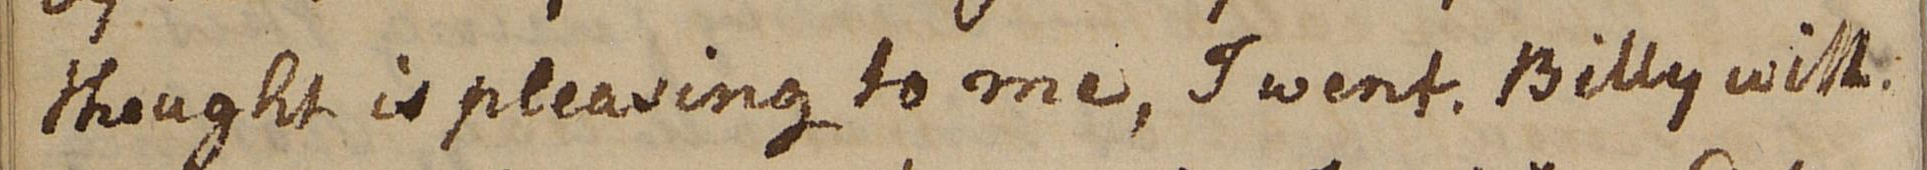thought is pleasing to me, I went Billy with.
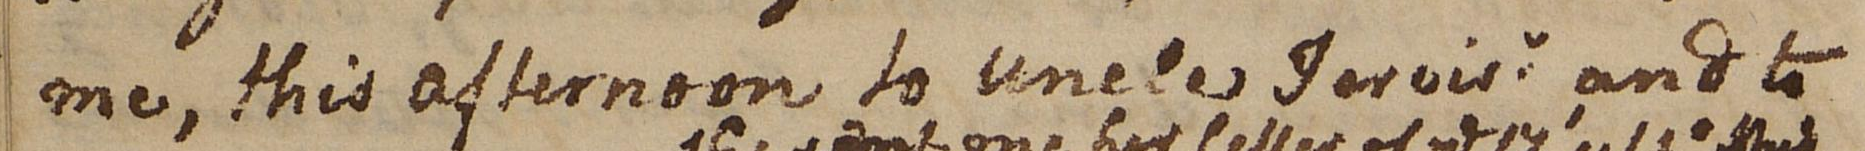me, this afternoon to Uncles Jervis^s. and to
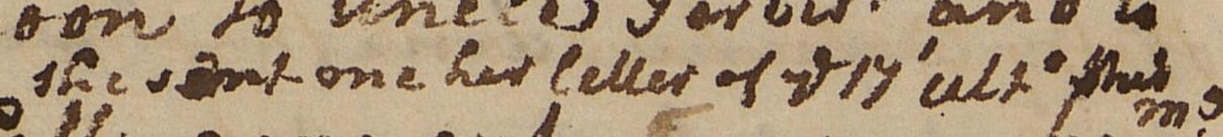she sent one her Celler of y^e 17 ult^o this
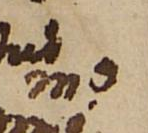m^g.
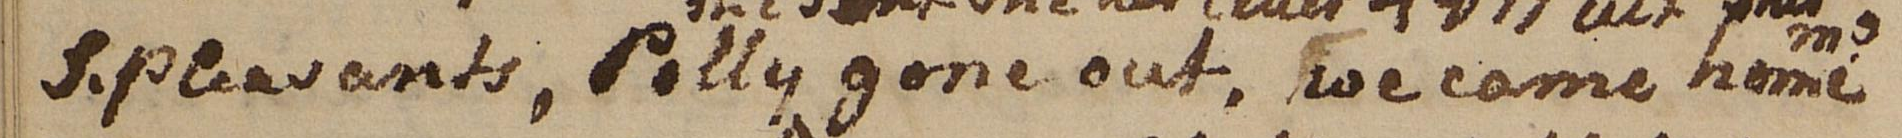S. Pleasants, Polly ^ gone out, we came home
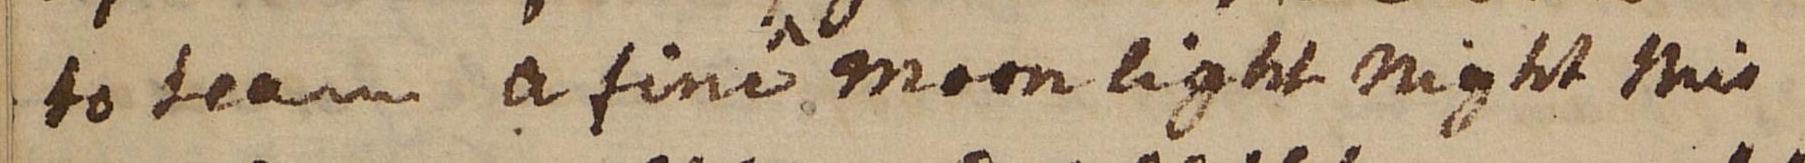to team a fine moon light night this
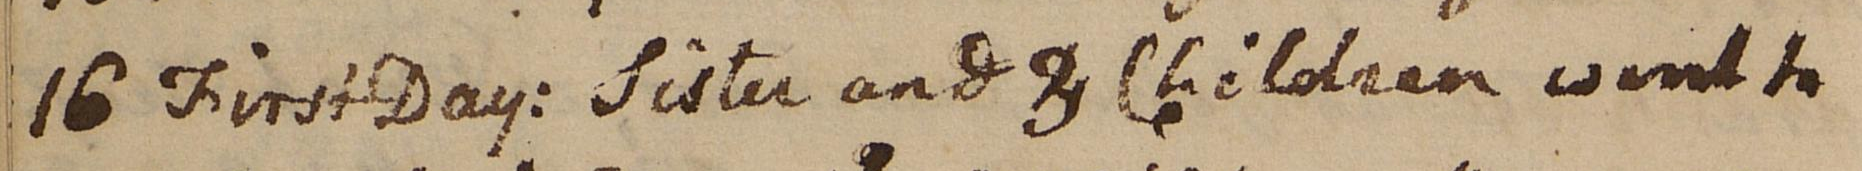16 First Day: Sister and 3 Children went to
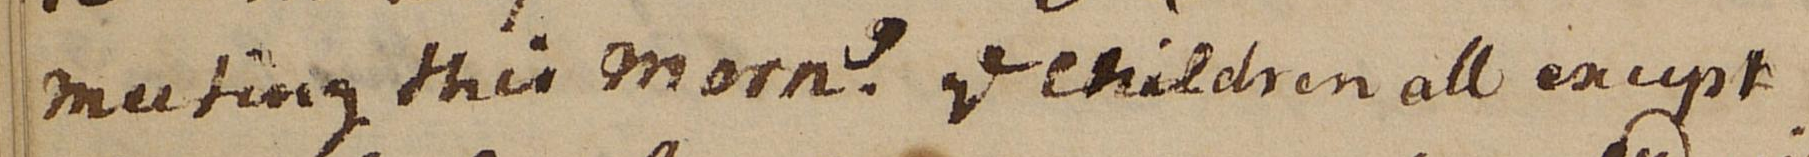meeting this Morn^g. y^e Children all except
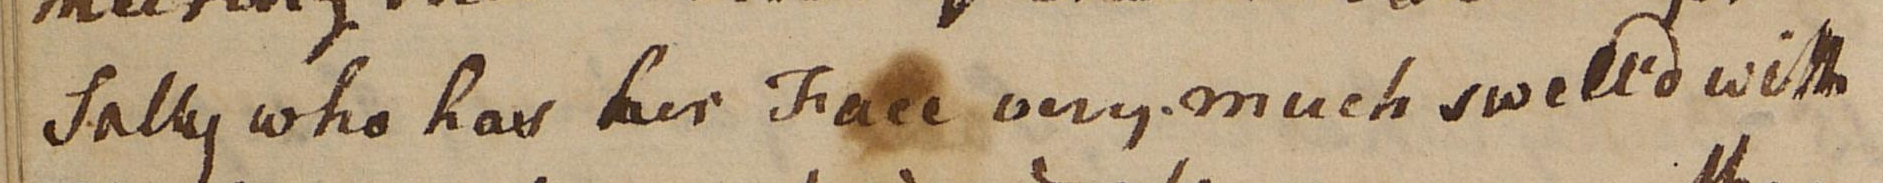Sally who has her Face very much swell'd with
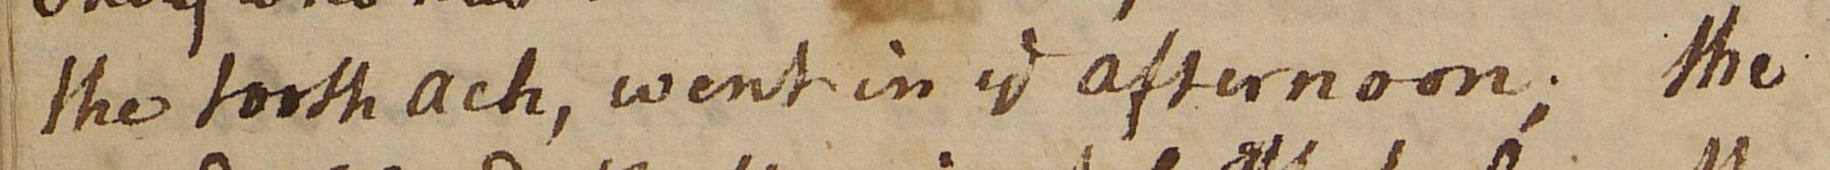the tooth ach, went in y^e afternoon. the
